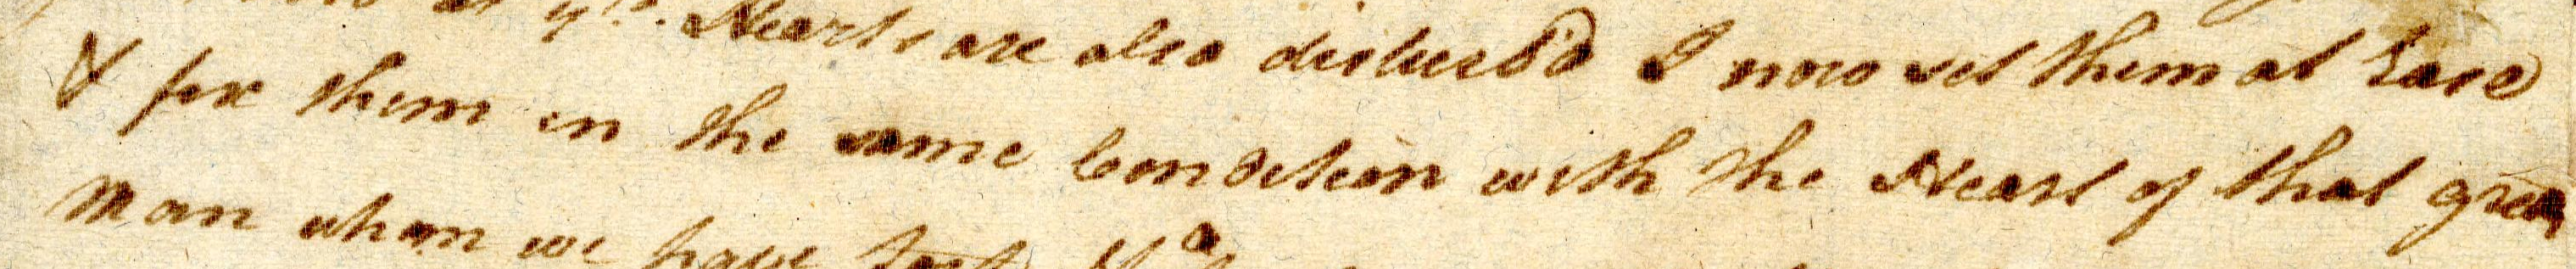& for them in the same Condition with the Heart of that great
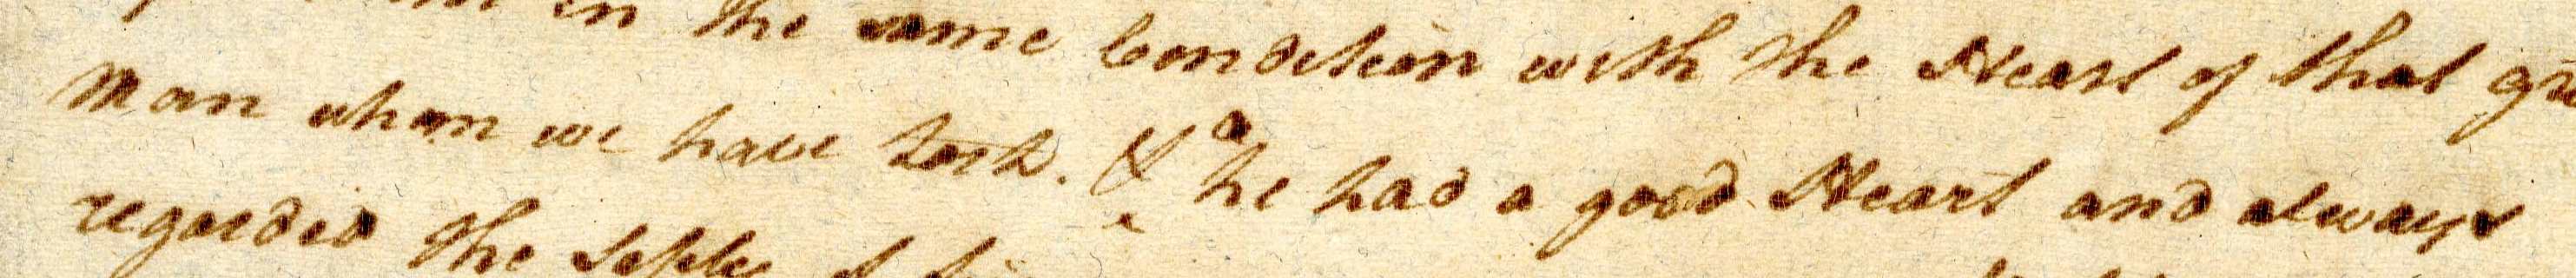Man whom we have Lost. & he had a good Heart and always
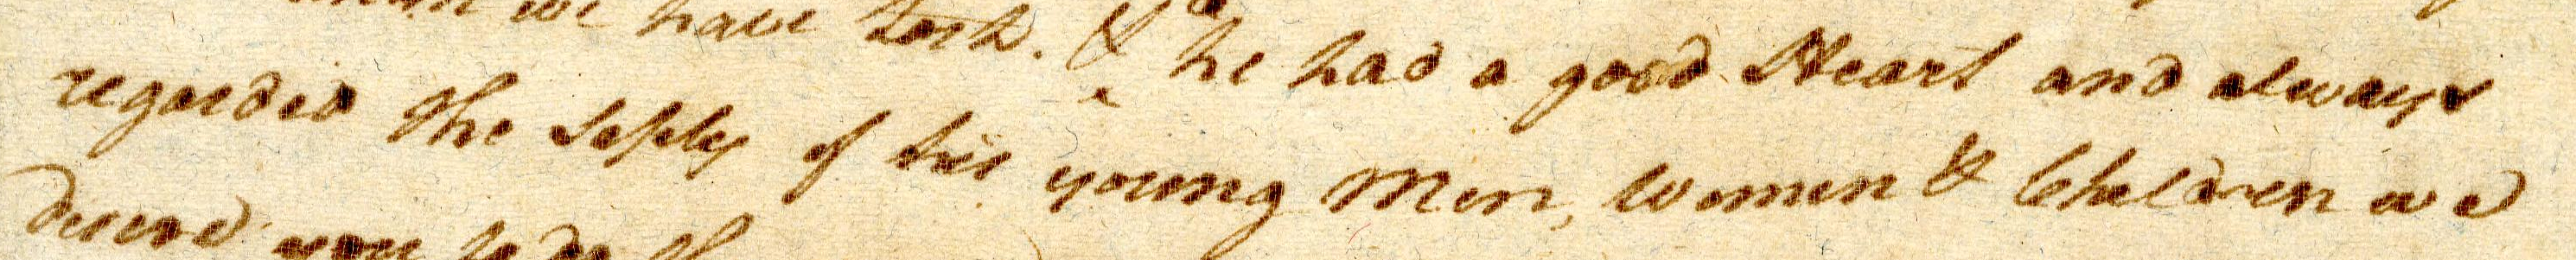regarded the safety of his young men, women & Children we
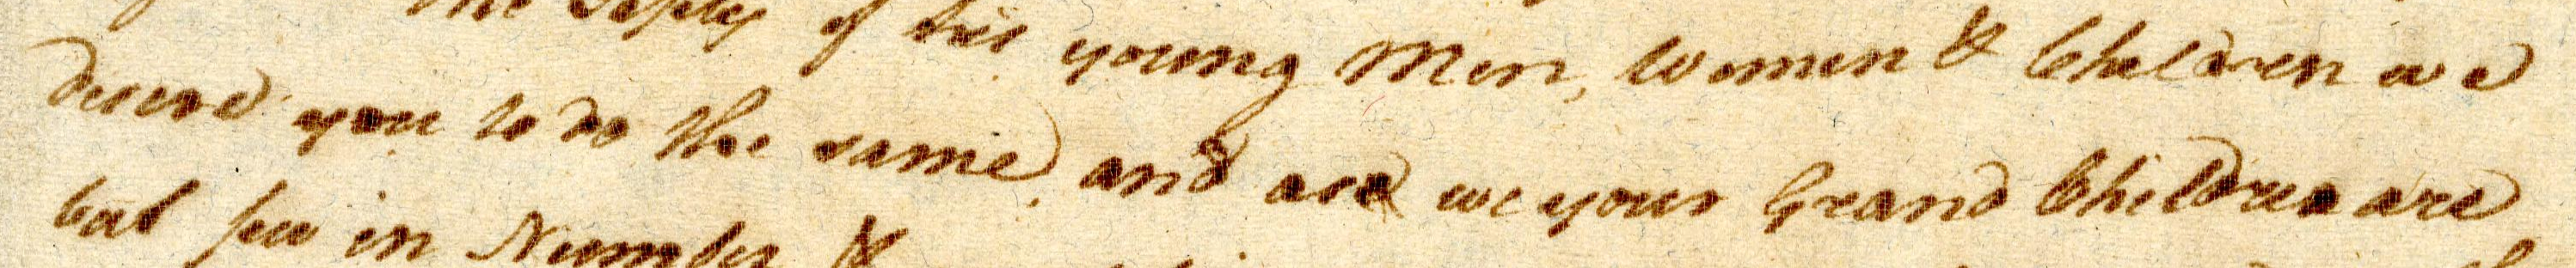desired you to do the same and as we your Grand Children are
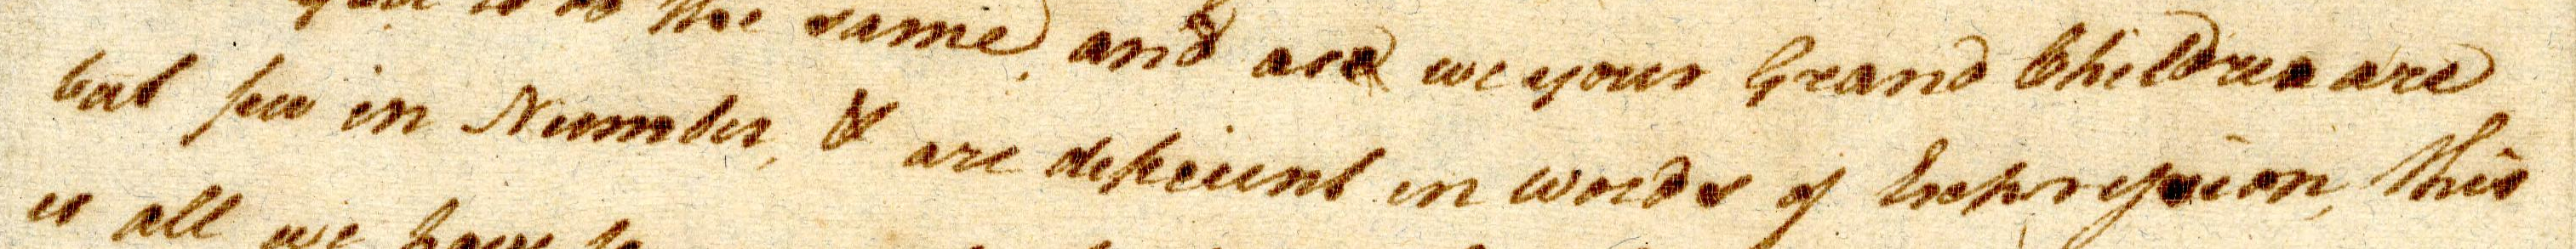but few in Number, & are deficient in words of Expression, this
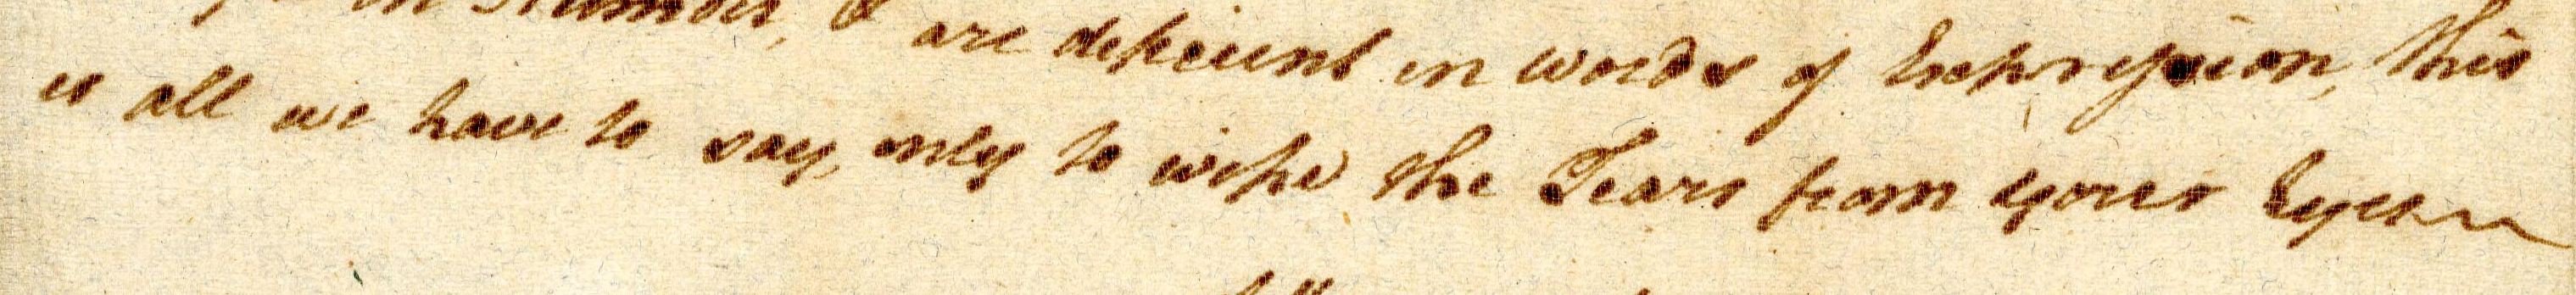is all we have to say, only to wipe the Tears from your Eyes-
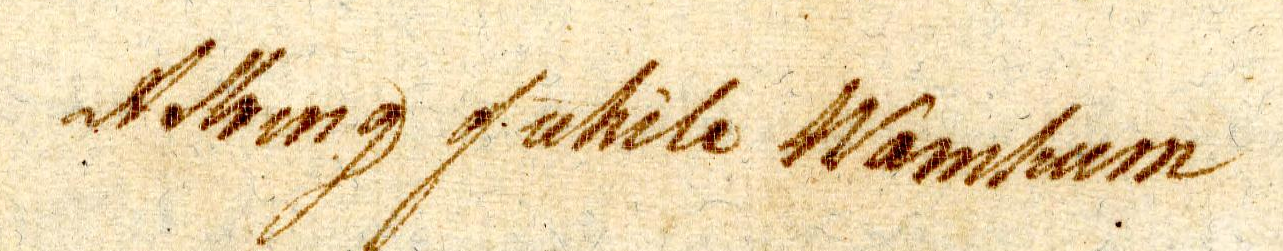A String of white Wampum
